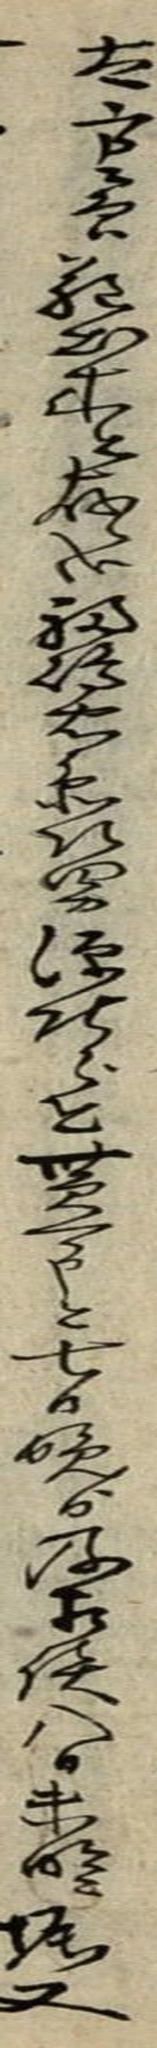太方ニ而ハ難出来と存候哉福嶋忠兵衛次男源次郎を貰可申と七日晩ゟ及相談八日未明ニ堀又
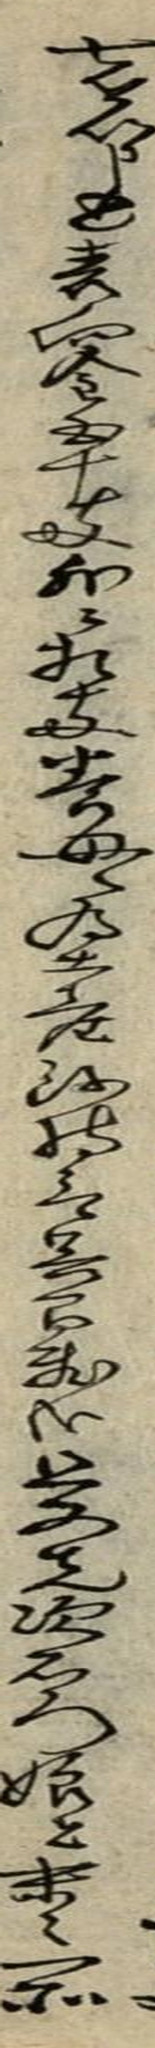七を以申込表向金五十両外ニ十両養母ヘ及土産致持参呉間敷哉且又先次郎右衛門娘と末々一所
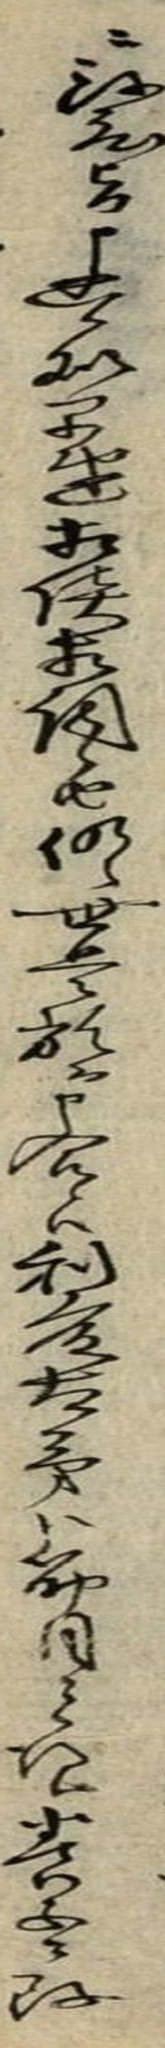ニ致度旨申込候拠早速相談相調候由仍之世上ニ於而申合候ハ利藤太弟ハ筋目ニ候得ハ養子ニ致
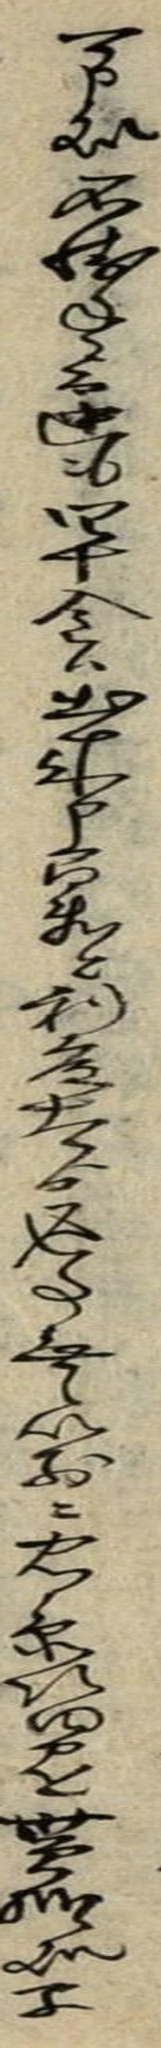可申処不勝手候ニ而迚も四十金ハ出来申間敷と利藤太ゟ返事無之以前ニ忠兵衛次男を貰掛候処早
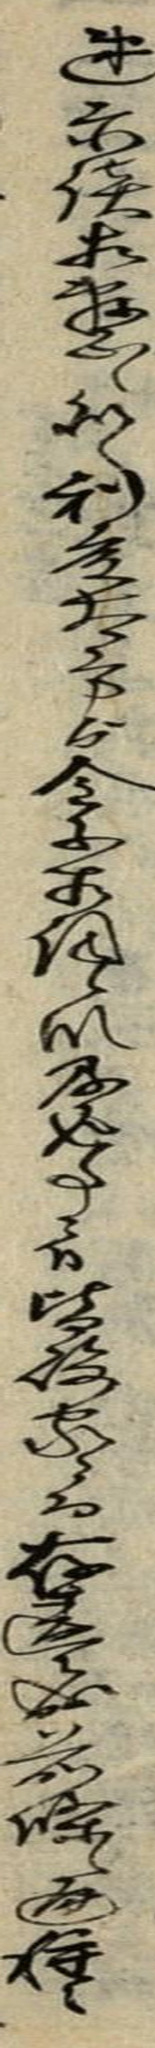速示談相整候処利藤太方ゟ金子相調候段及返事ニ付皆崎家ニ而存違ニ成前条之通種々
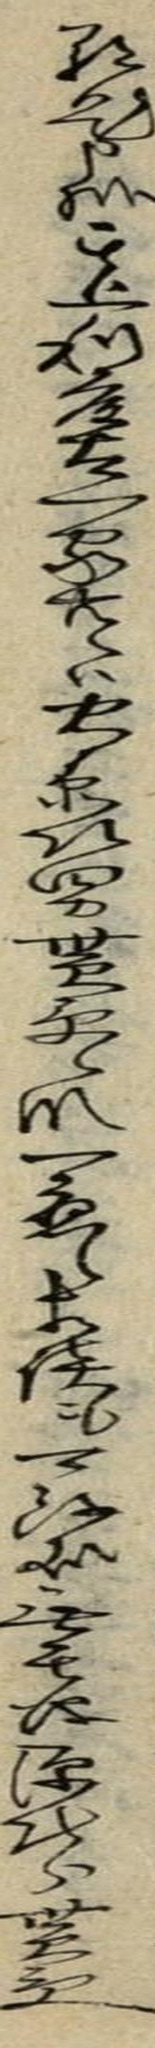難題申拠其上利藤太一家共ヘハ忠兵衛次男貰受候段一応之相談も可致処無其儀源次郎貰受
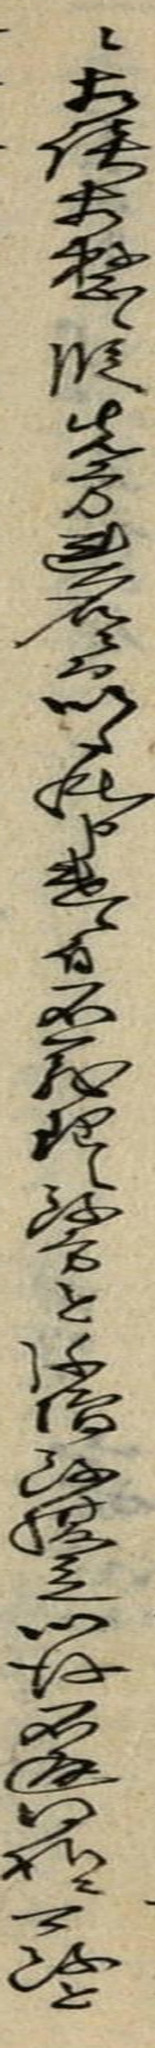ニ相談相整候段先方連名ニ而以手紙申遣候ニ付不義理之致方と弥増致腹立以後不通同様ニ可致と
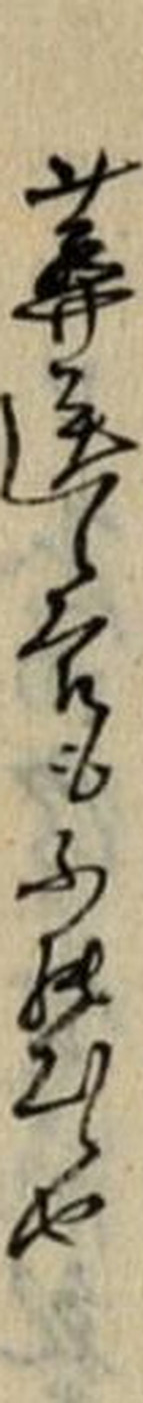葬送の節も不罷出候也
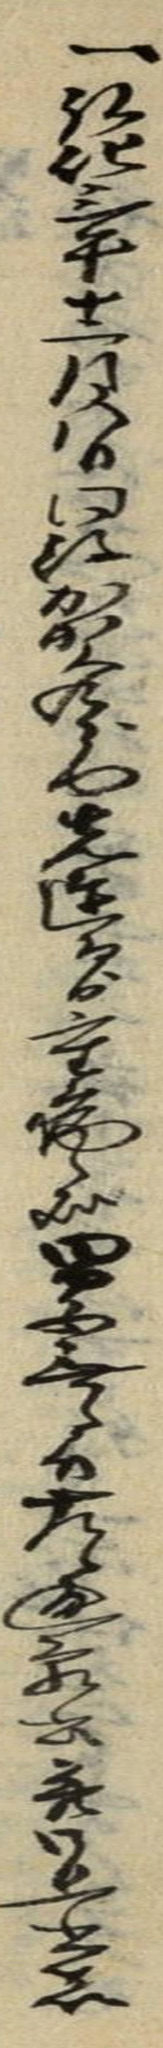一弘化三午十一月八日同役加賀九郎右衛門先達而ゟ重病之処男子有之ニ付左之通願書并口上書を以
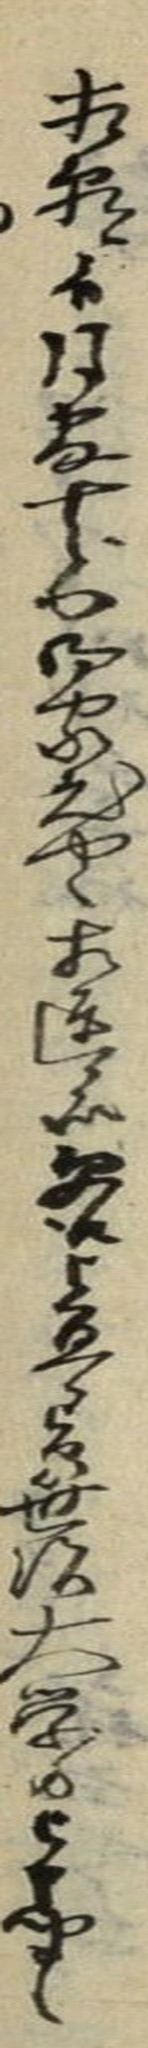相願候ニ付月番十郎右衛門御家老中ヘ相達候処受取被下置候旨笹治大学方被申聞候
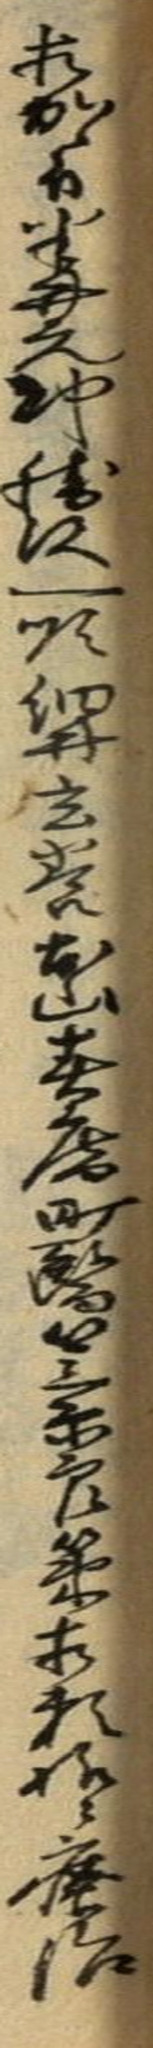相加候ニ付半井元冲勝沢一順細井玄養本山春庵町医笠原良策相頼様ニ療治
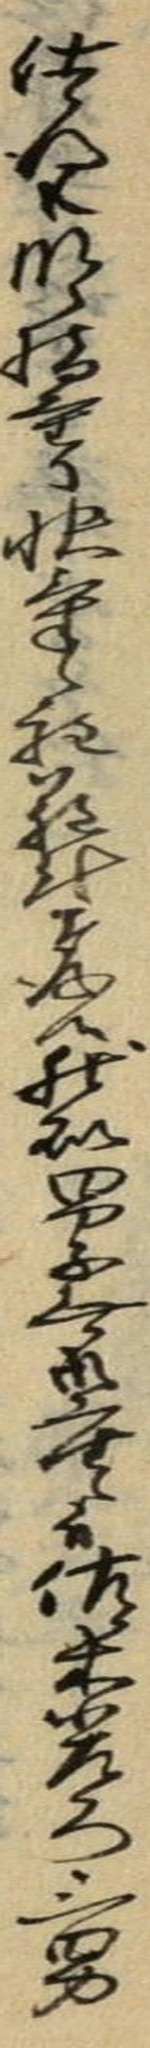仕候得共段々指重り快気之程難計奉存候然処男子無御座候ニ付佐々木小左衛門三男
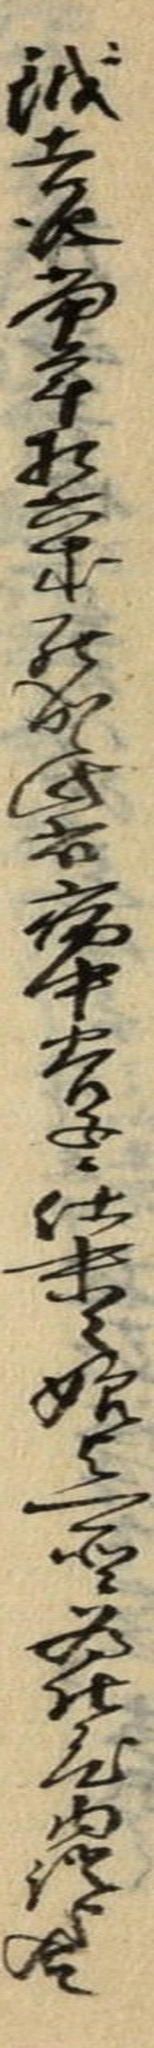誠吉儀当年拾六歳罷成此者病中養子ニ仕末々娘与一所ニ為仕度内証申合候
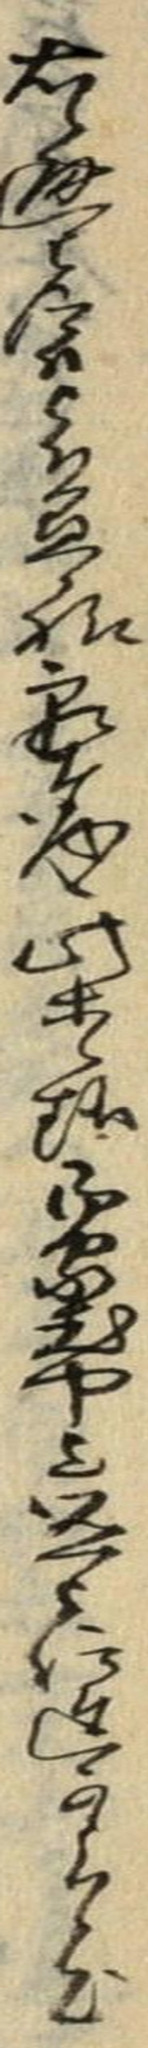右之通被仰付被下置候様願奉存候此等之趣御家老中迄宜被仰達可被下候已上
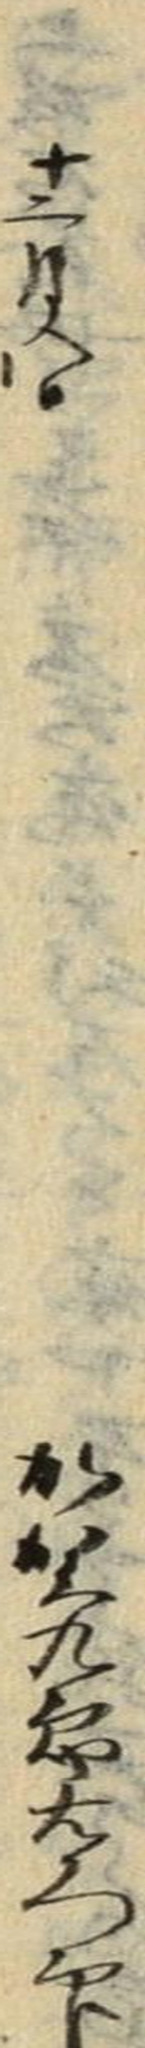十二月八日加賀九郎右衛門印
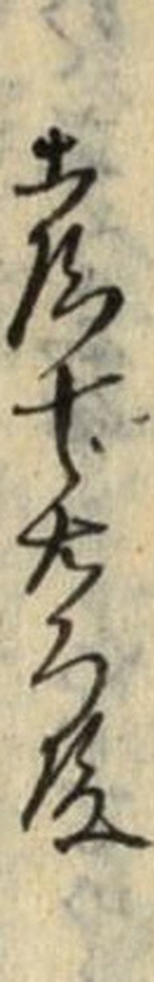土屋十郎右衛門殿
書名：養子縁組之部
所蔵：福井県文書館 Fukui Prefectural Archives
